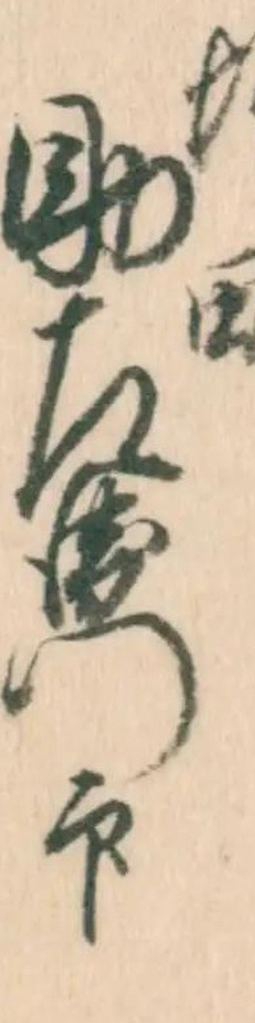名主助左衛門印
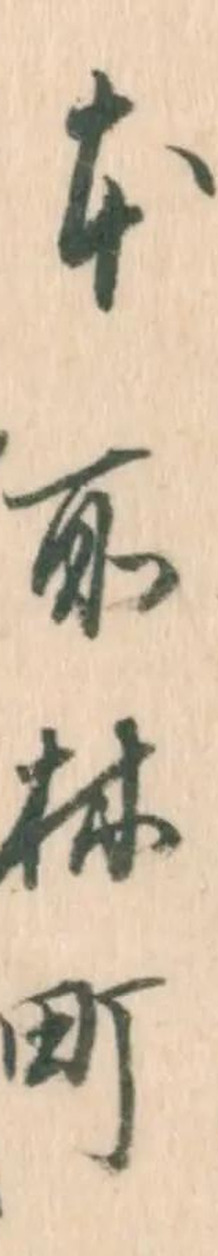本所林町
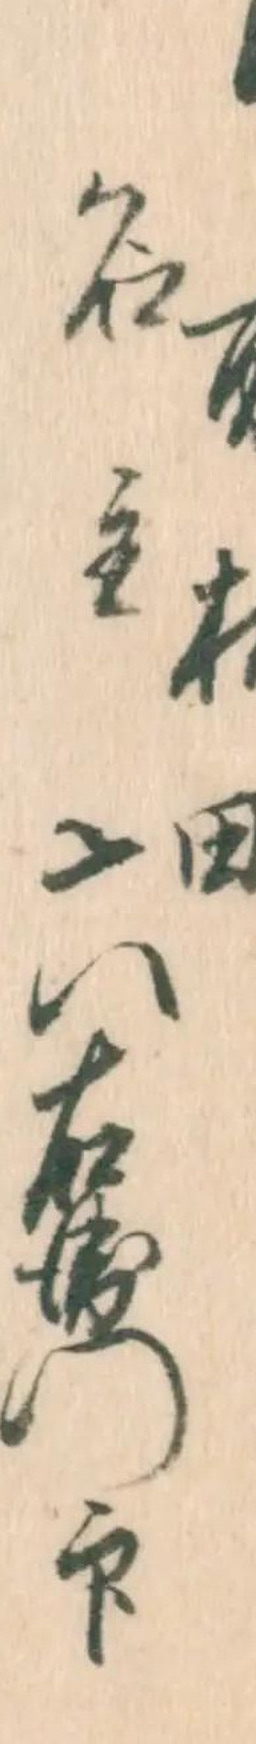名主六右衛門印
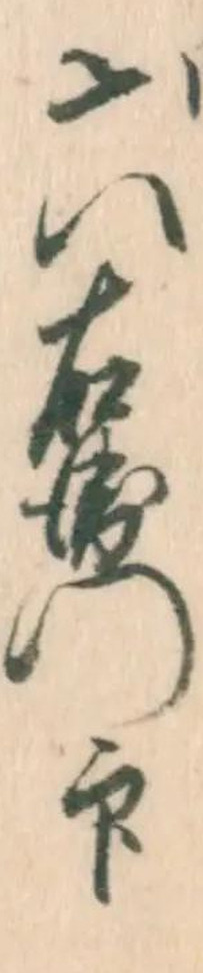名主六右衛門印
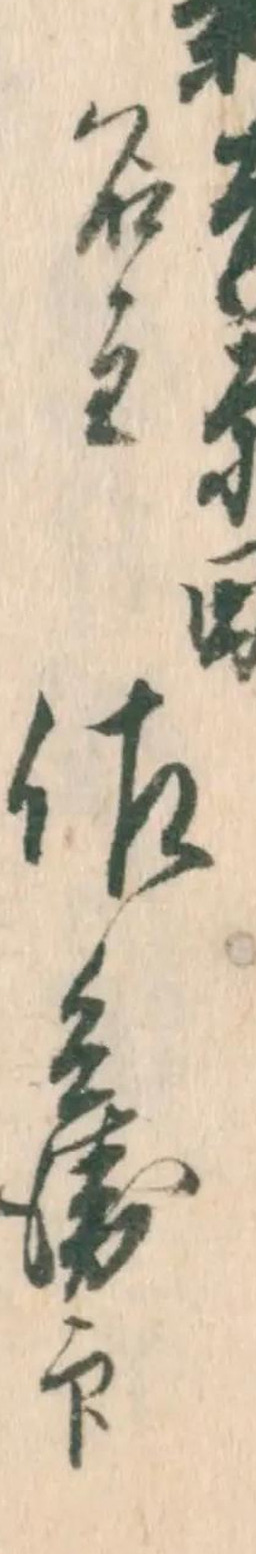名主佐兵衛印
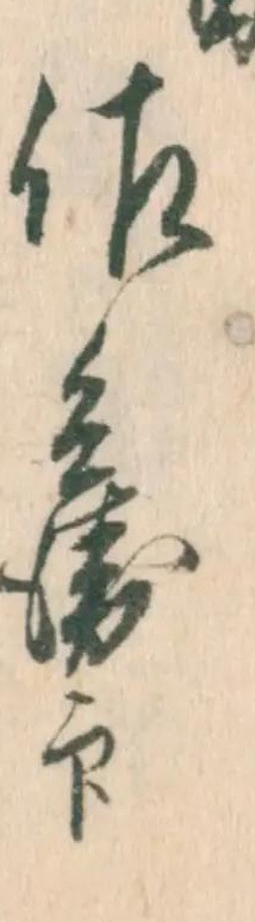名主佐兵衛印
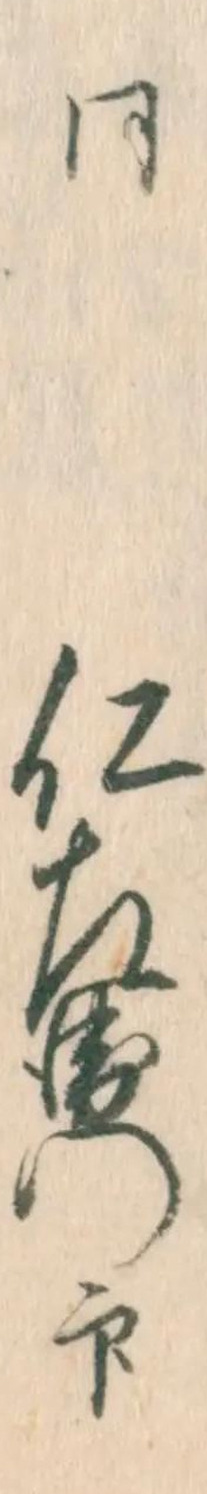同仁左衛門印
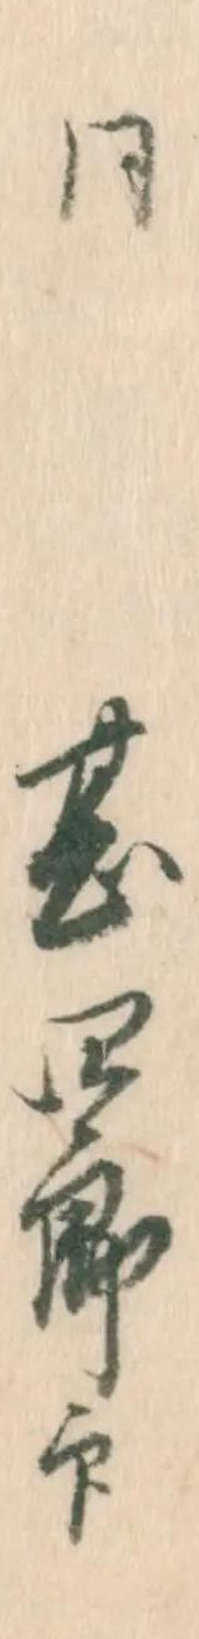同甚四郎印
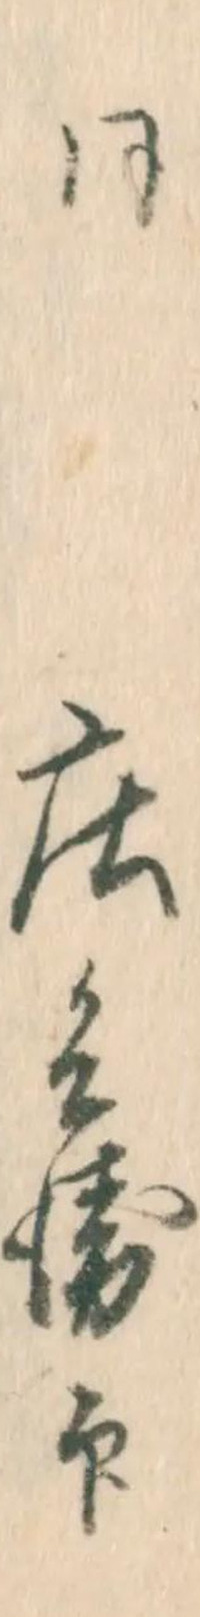同庄兵衛印

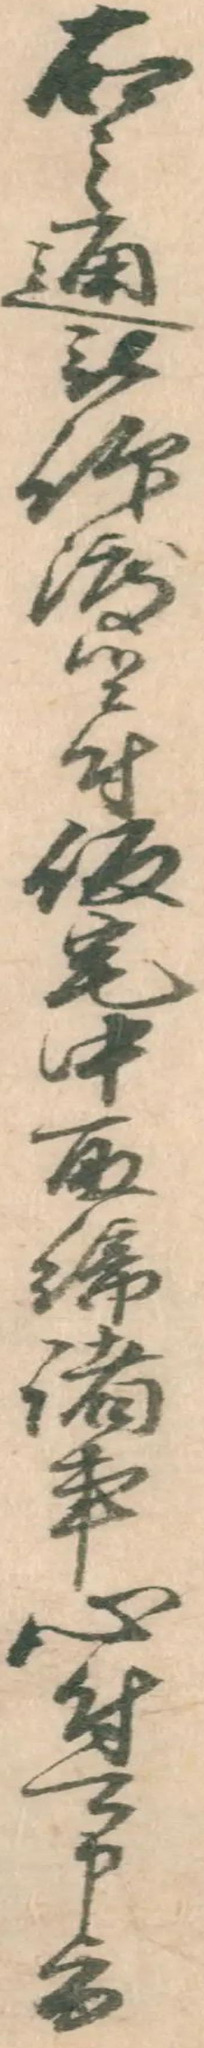右之通被仰渡候ニ付仮宅中取締諸事心付可申旨
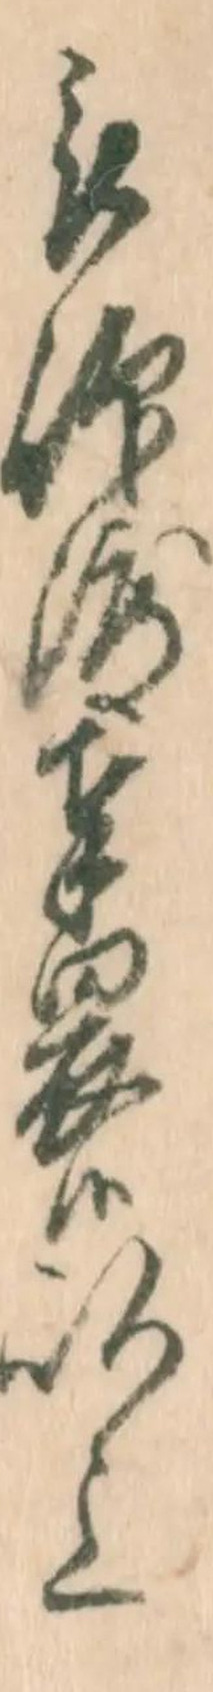被仰渡奉畏候以上
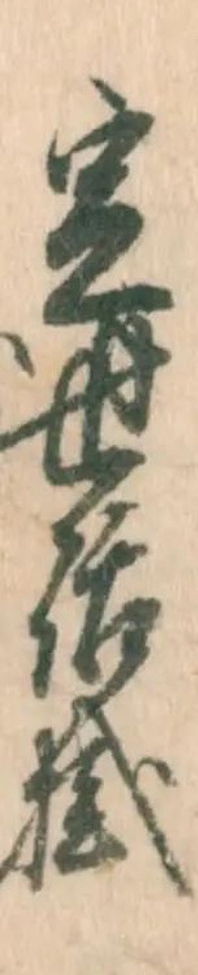定世話掛
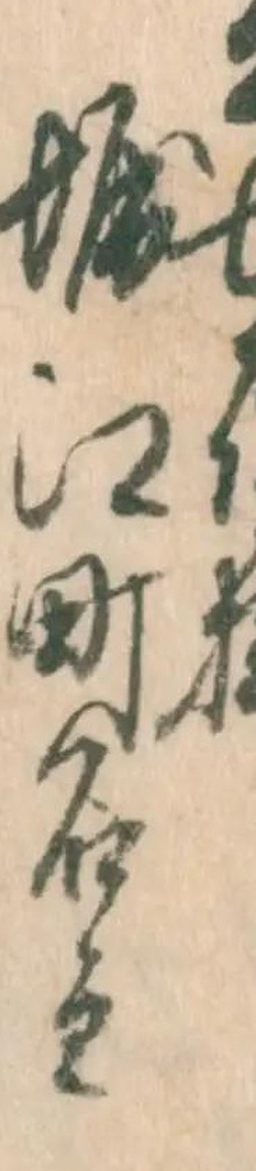堀江町名主
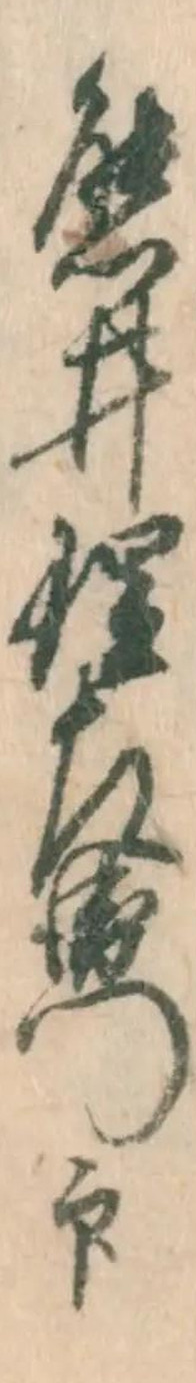熊井理左衛門印
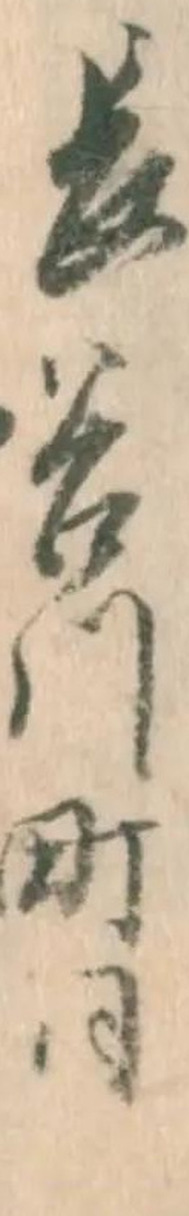長谷川町同
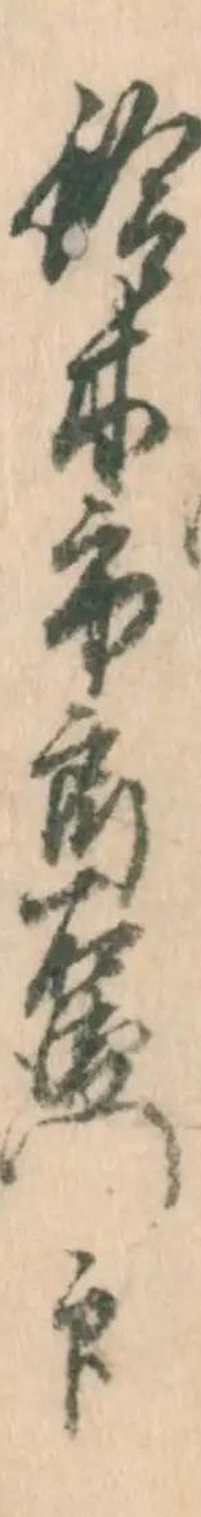鈴木市郎右衛門印
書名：地震災書留 2巻. [2] 内表紙に「地震一件　安政二卯年十月」とあり
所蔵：国立国会図書館 National Diet Library, JAPAN
